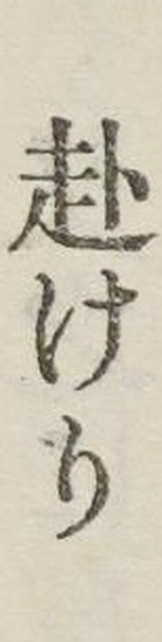赴けり
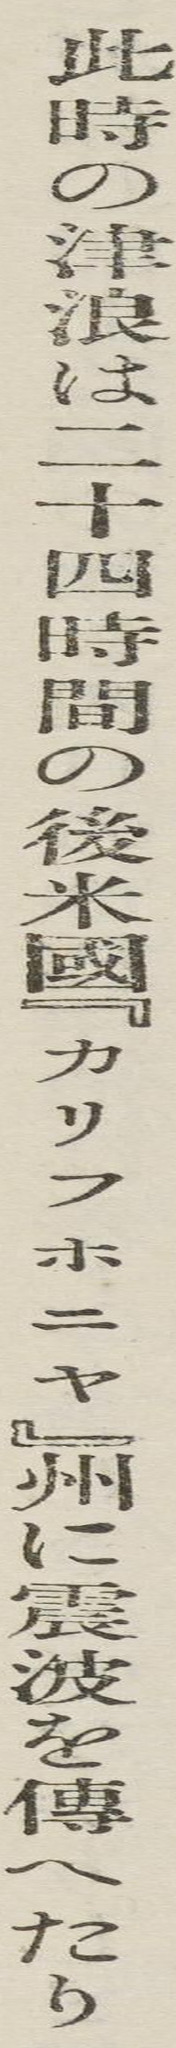此時の津浪は二十四時間の後米国『カリフホニヤ』州に震波を伝へたり
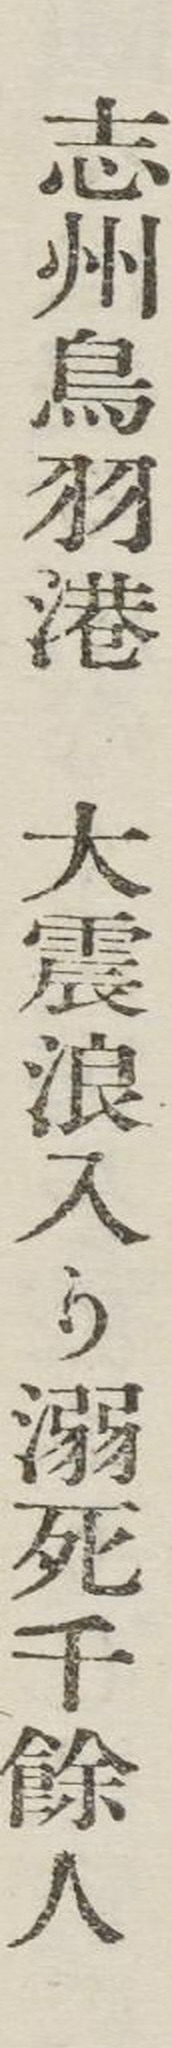志州鳥羽港大震浪入り溺死千余人
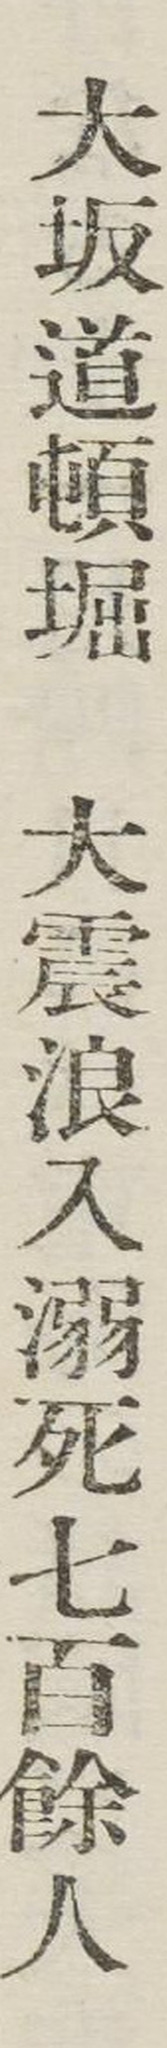大坂道頓堀大震浪入溺死七百余人
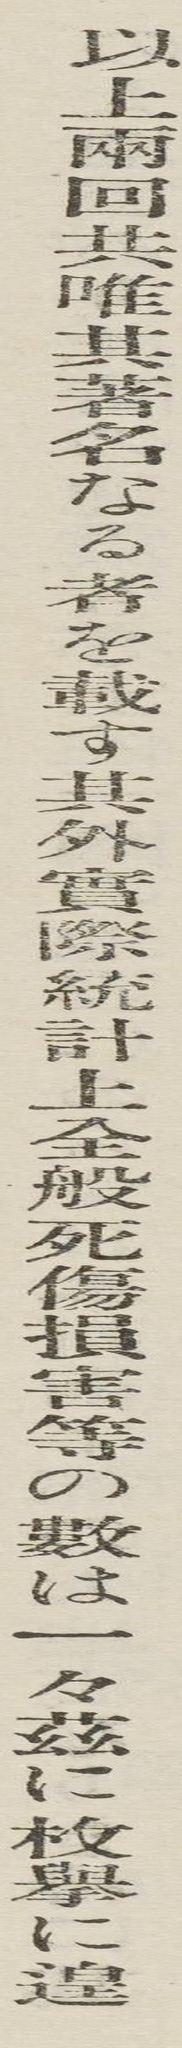以上両回共著名なる者を載す其外実際統計上全般死傷損害等の数は一々茲に枚挙に遑
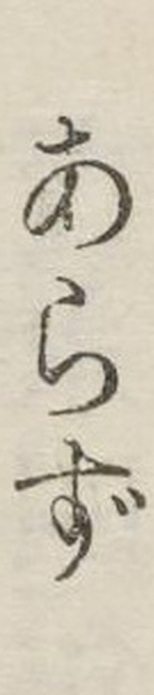あらず
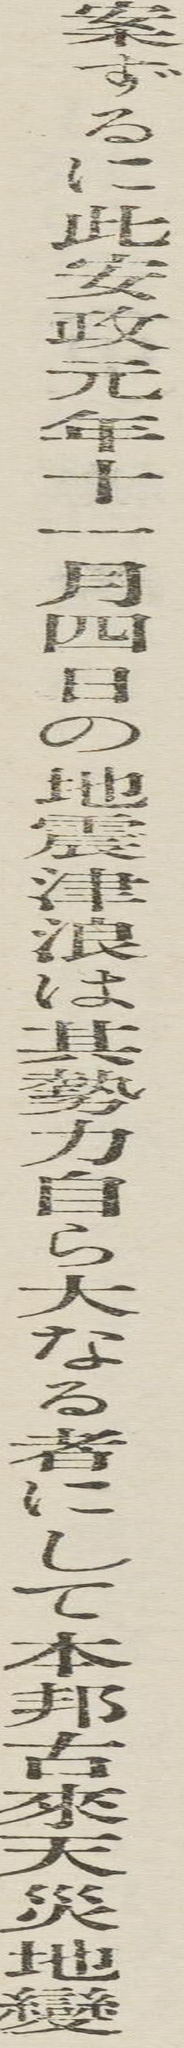案ずるに此安政元年十一月四日の地震津浪は其勢力自ら大なる者にして本邦古来天災地変
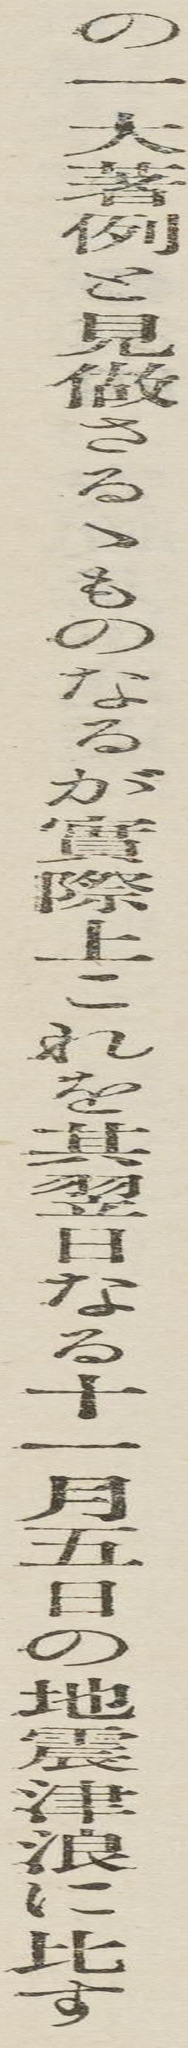の一大著例と見做さるゝものなるが実際上これを其翌日なる十一月五日の地震津浪に比す
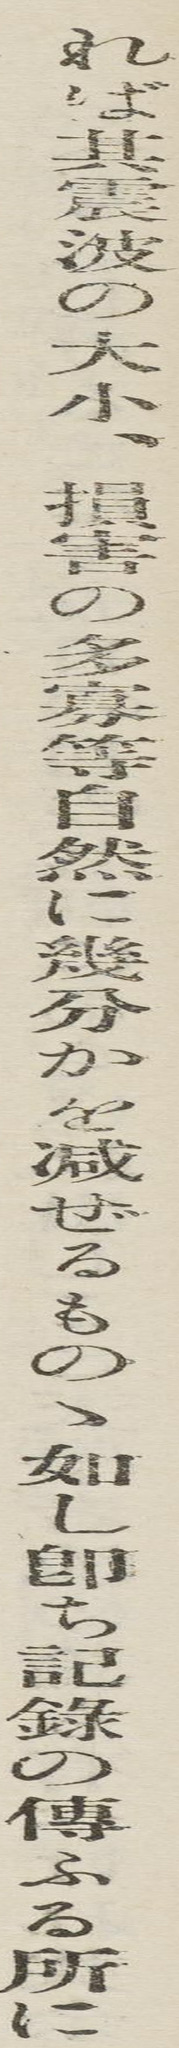れば其震波の大小、損害の多寡等自然に幾分かを減ぜるものゝ如し即ち記録の伝ふる所に
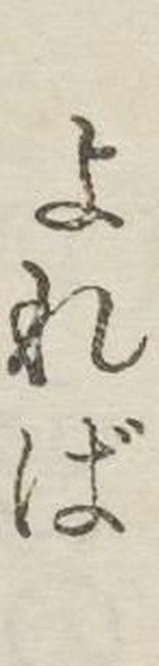よれば
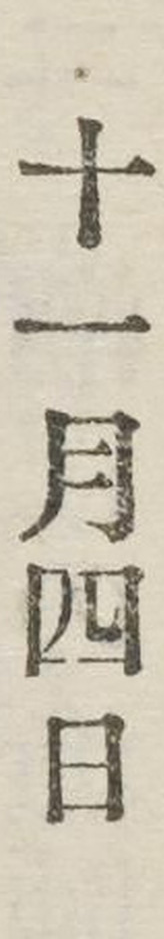十一月四日
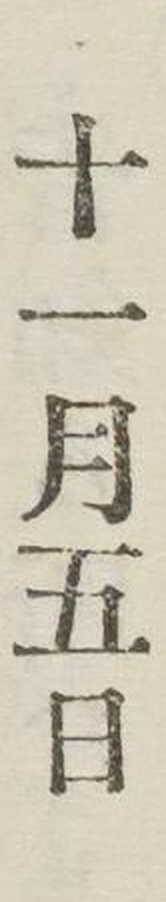十一月五日
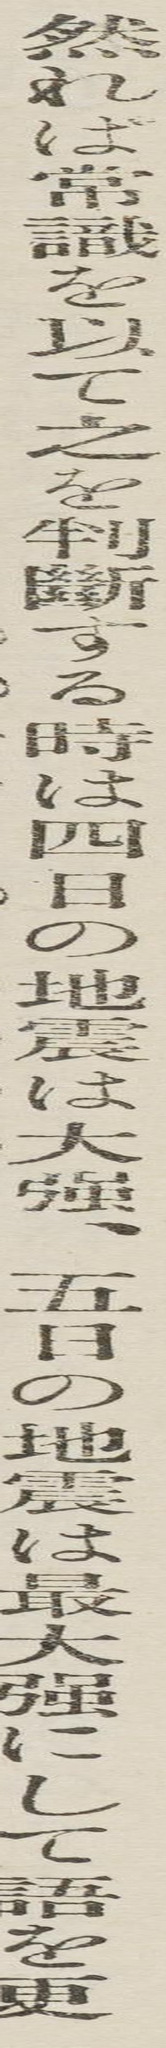然れば常識を以て之を判断する時は四日の地震は大強、五日の地震は最大強にして語を更
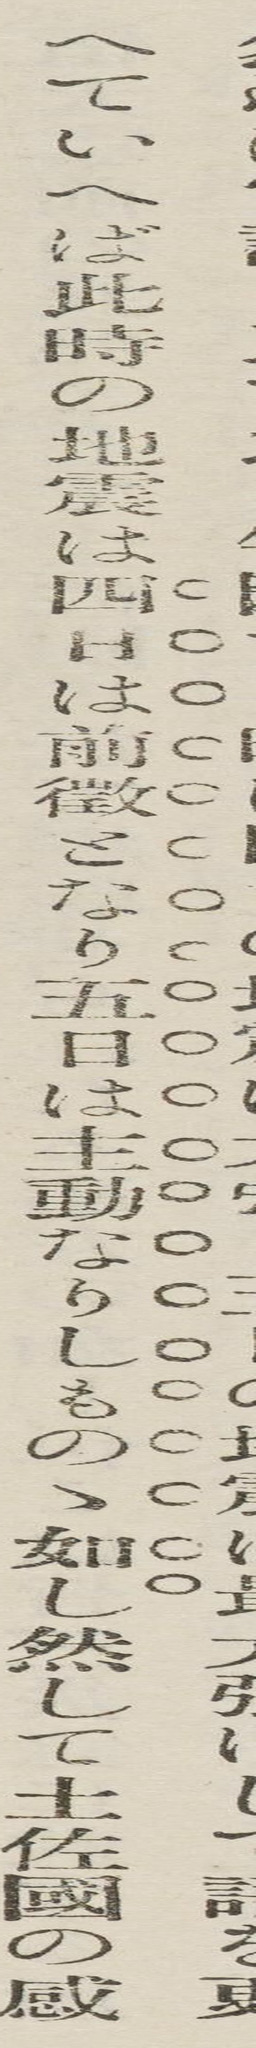へていへば此時の地震は四日は前徴となり五日は主動なりしものゝ如し然して土佐国の感
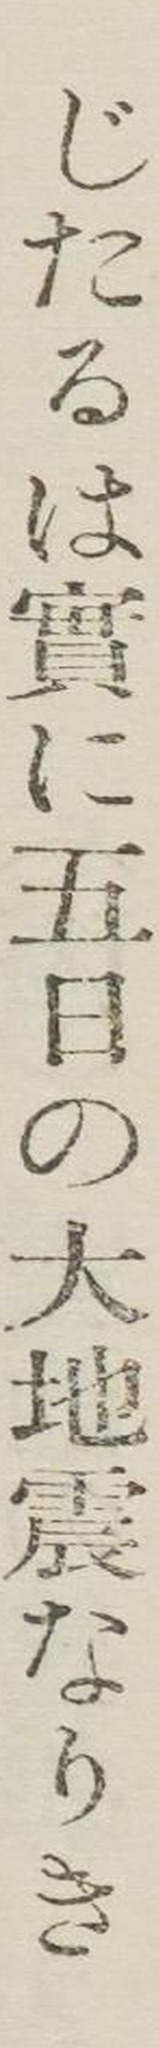じたるは実に五日の大地震なりき
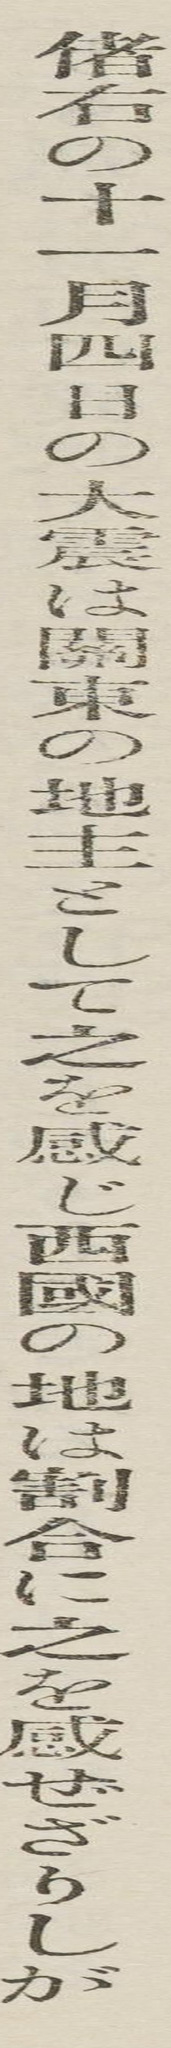偖右の十一月四日の大震は関東の地主として之を感じ西国の地は割合に之を感ぜざりしが
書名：土佐古今ノ地震
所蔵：東京大学地震研究所図書室 Earthquake Research Institute Library, The University of Tokyo, JAPAN
